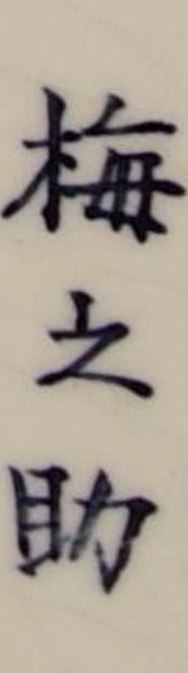梅之助
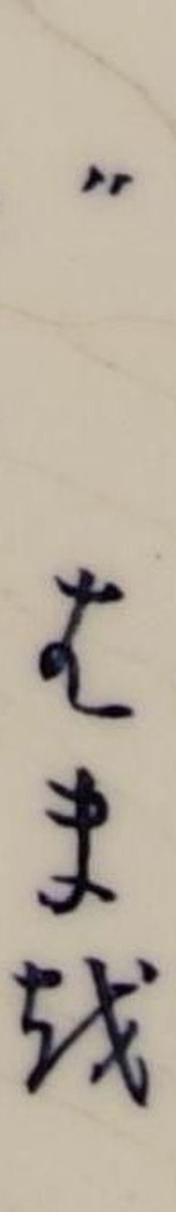はまを
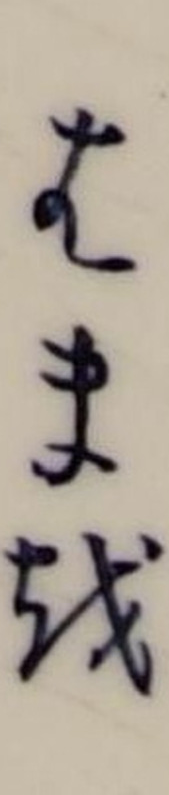はまを
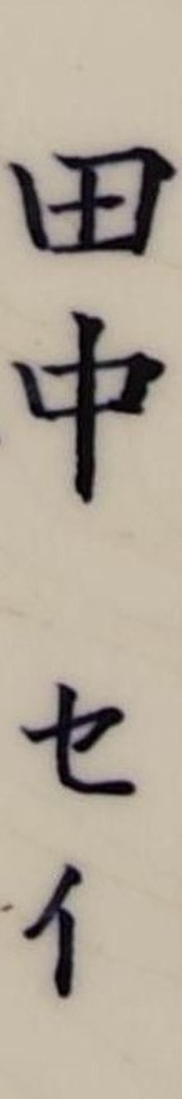田中セイ
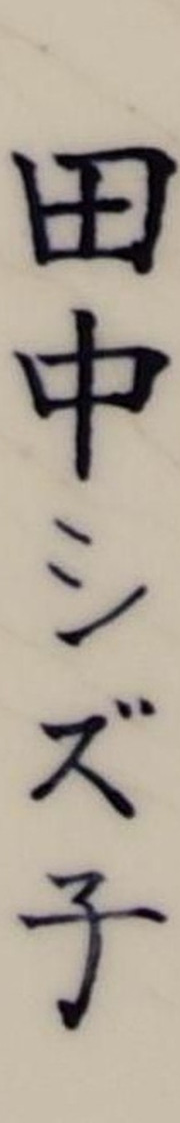田中シズ子
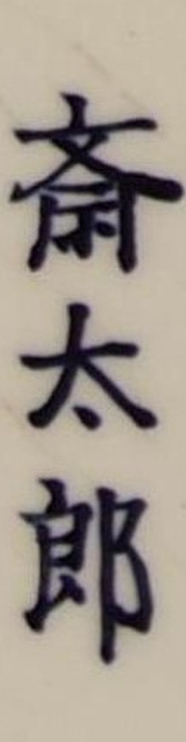斉太郎
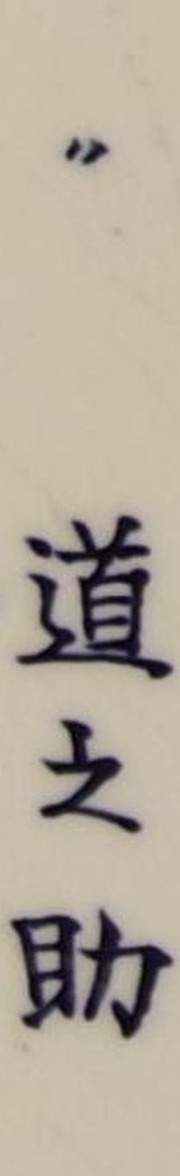道之助
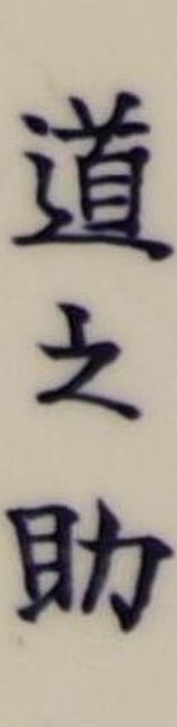道之助
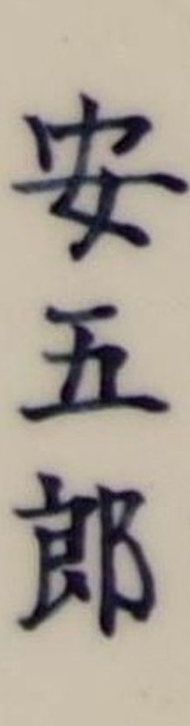安五郎
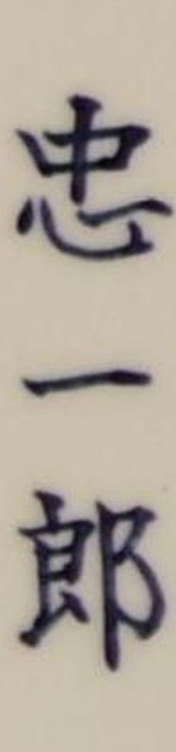忠一郎
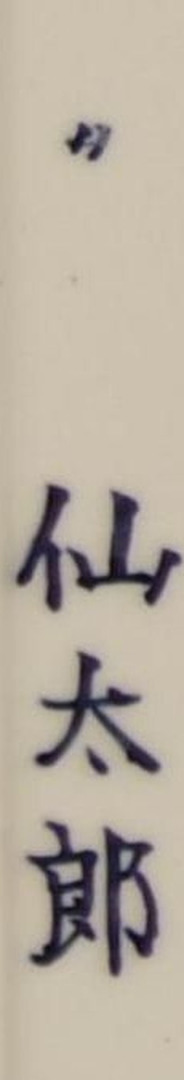仙太郎
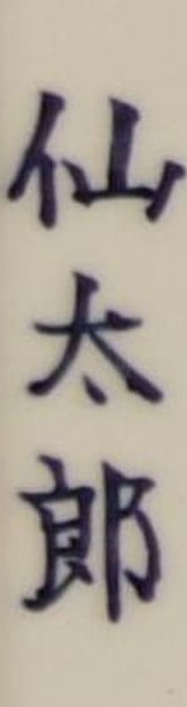仙太郎

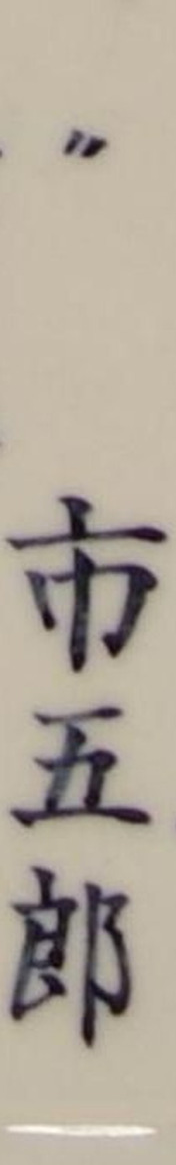市五郎
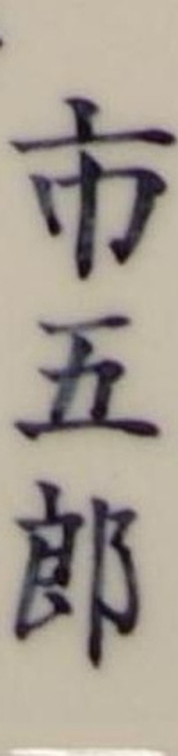市五郎
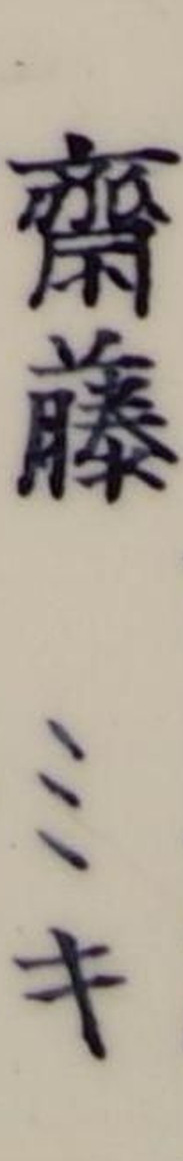齋藤ミキ

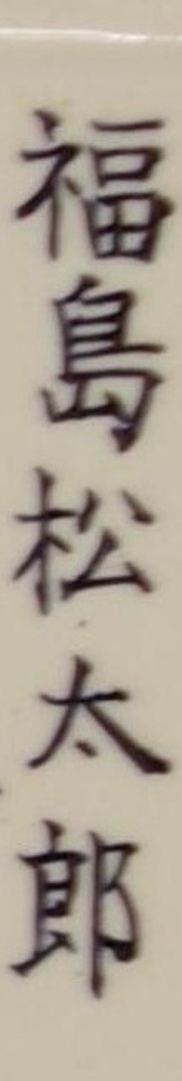福島松太郎
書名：E~L
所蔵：高野山金剛峯寺
